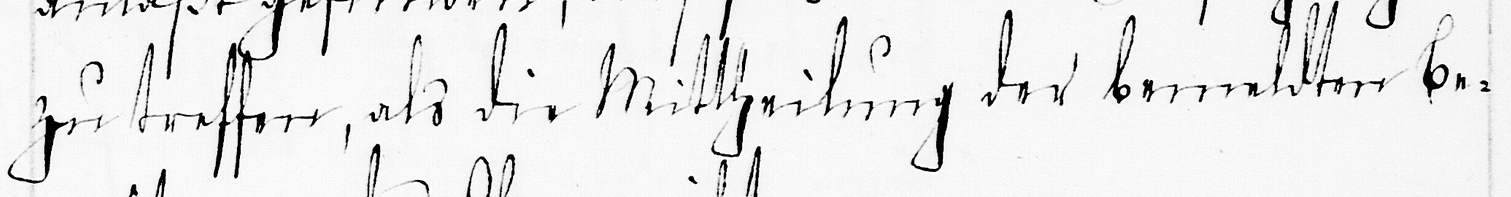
zu treffen, als die Mittheilung der bemeldten Be¬
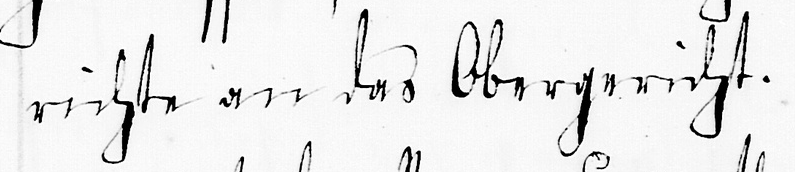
richte an das Obergericht.
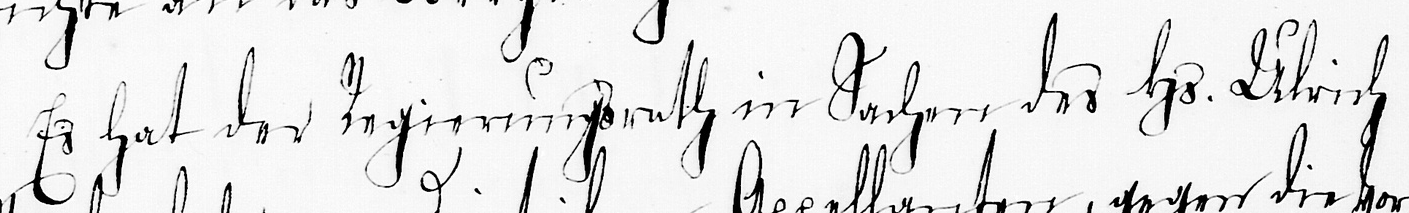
Es hat der Regierungsrath in Sachen des Hs. Ulrich
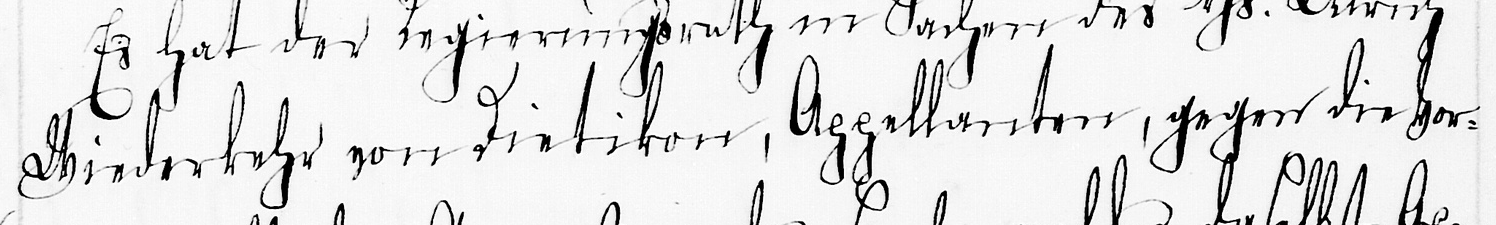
Wiederkehr von Dietikon, Appellanten, gegen die
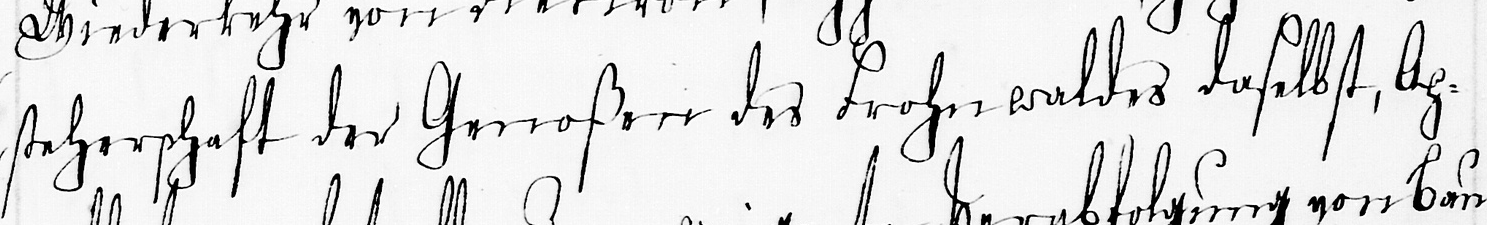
steherschaft der Genoßen des Frohnwaldes daselbst, Ap¬
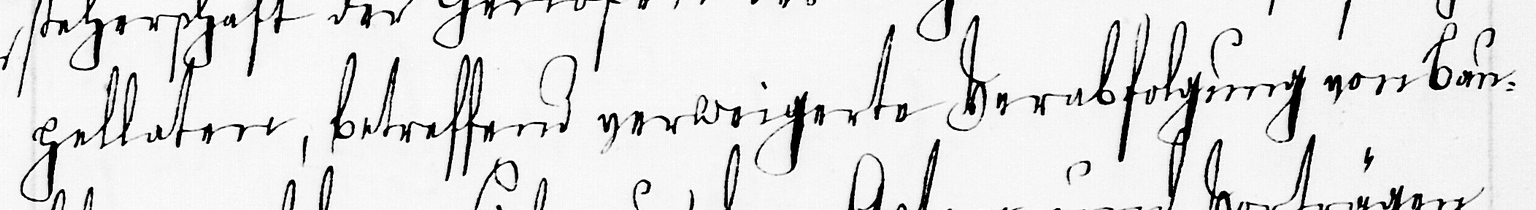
pellaten, betreffend verweigerte Verabfolgung von Bau¬
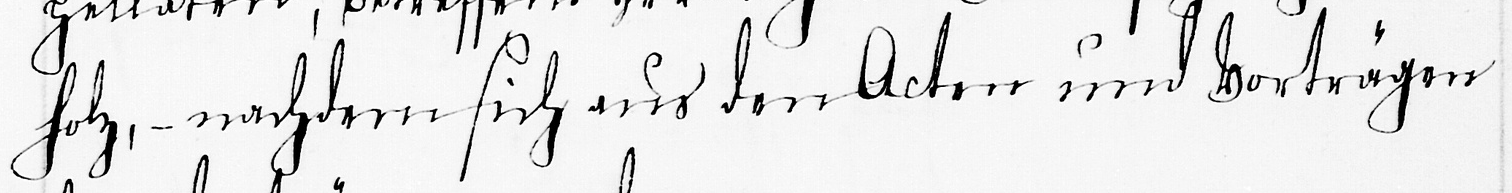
holz, – nachdem sch aus den Acten und Vorträgen
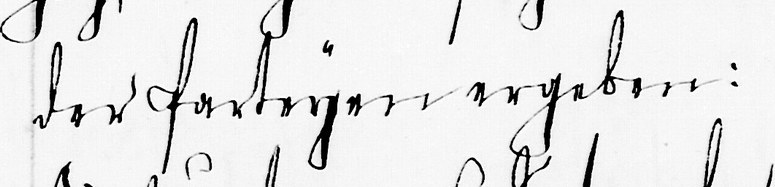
der Parteyen ergeben:
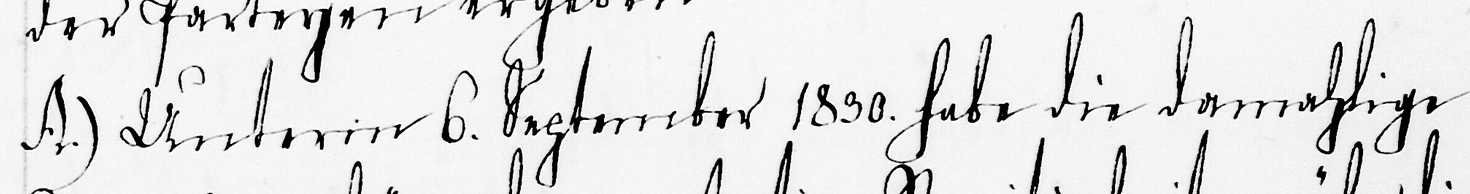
A.) Unterm 6. September 1830. habe die damahlige
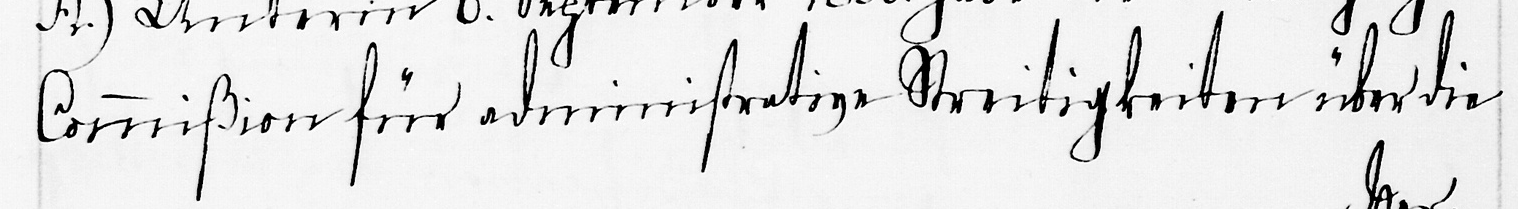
Commißion für administrative Streitigkeiten über die
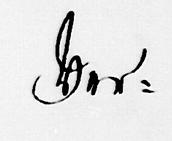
Vor¬
